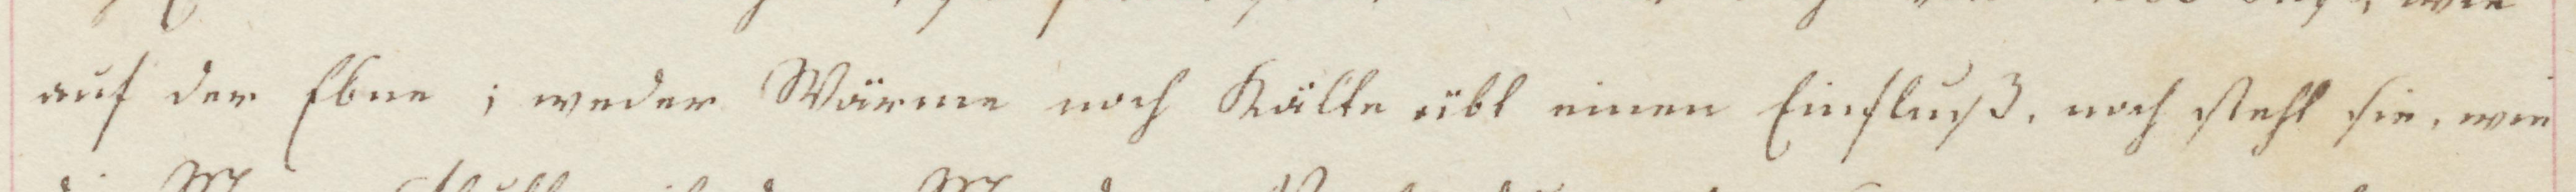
auf der Ebene; weder Wärme noch Kälte übt einen Einfluß, noch steht sie, wie
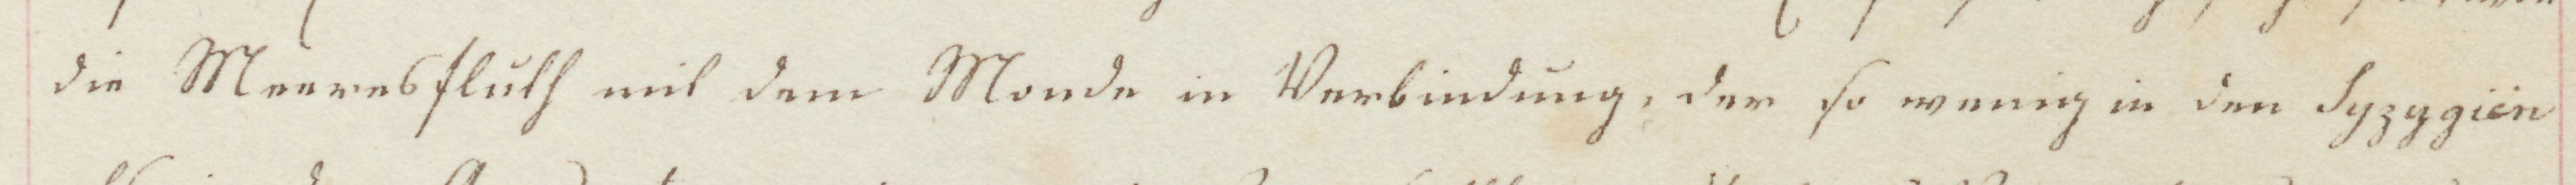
die Meeresfluth mit dem Monde in Verbindung, der so wenig in den Syzygiien
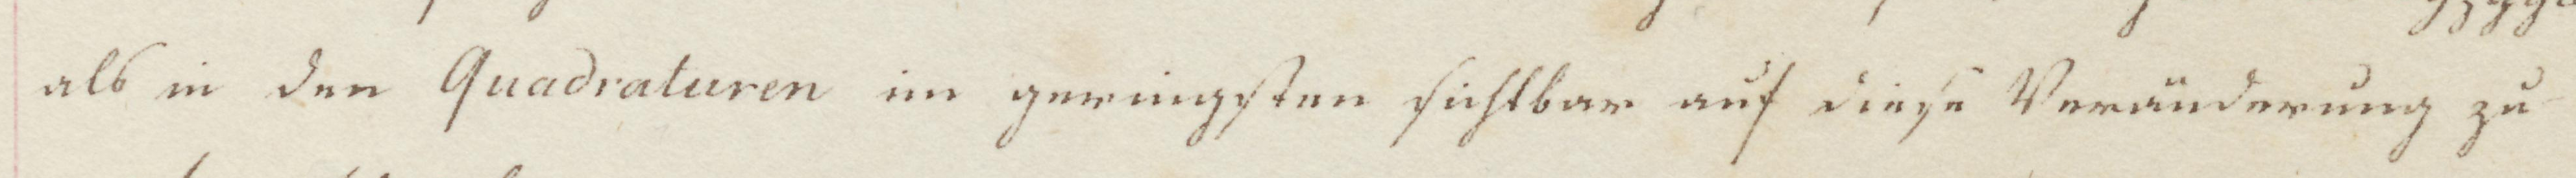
als in den Quadraturen im geringsten sichtbar auf diese Veränderung zu
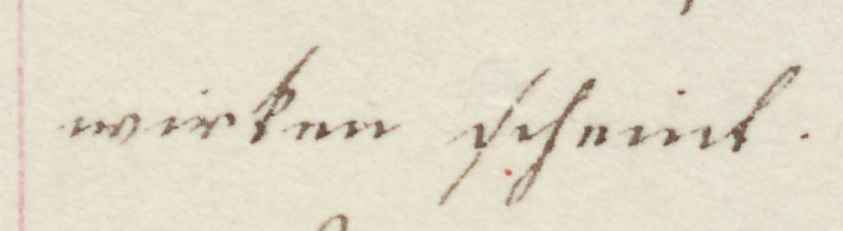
wirken scheint.
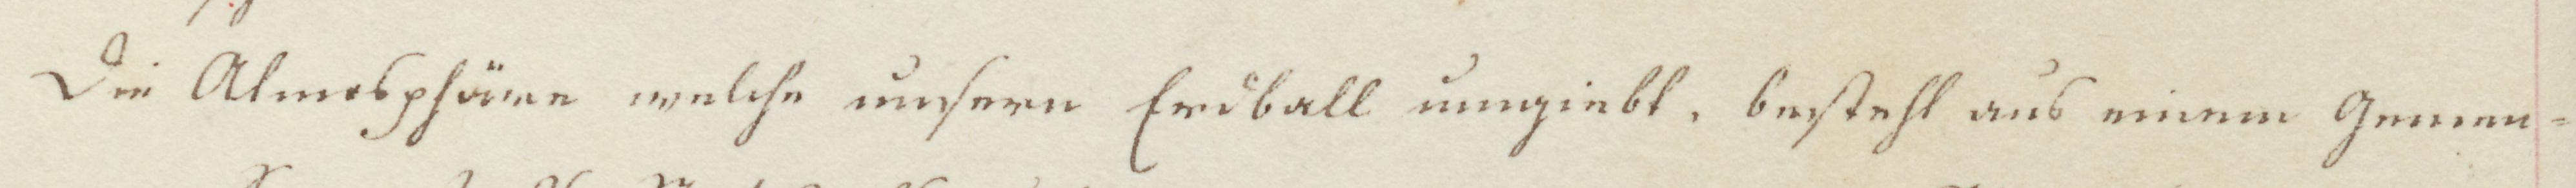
Die Atmosphäre welche unsern Erdball umgiebt, besteht aus einem Gemen-
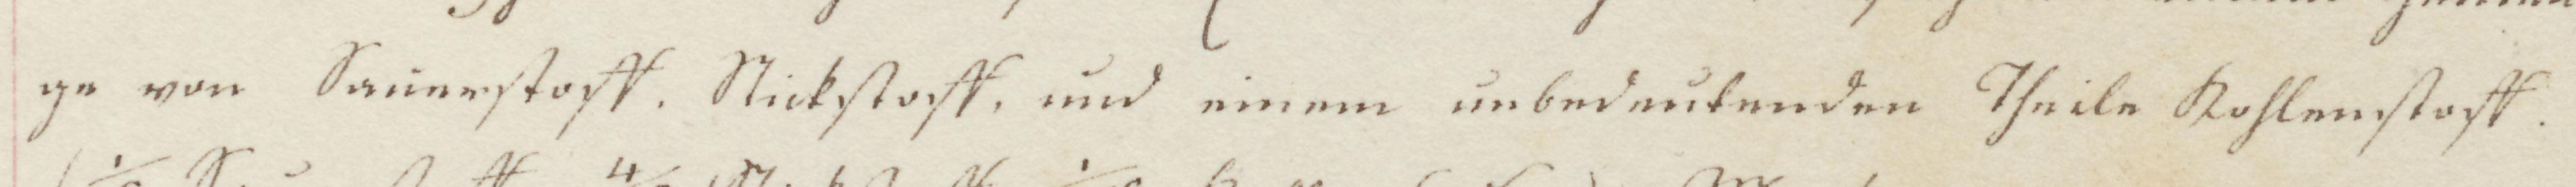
ge von Sauerstoff, Stickstoff, und einem unbedeutenden Theile Kohlenstoff
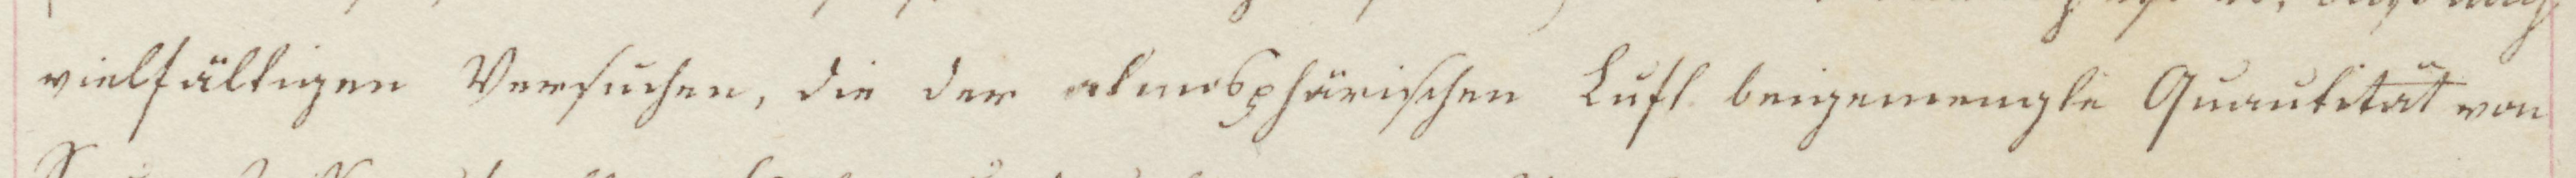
vielfältigen Versuchen, die der atmosphärischen Luft beigemengte Quantität von
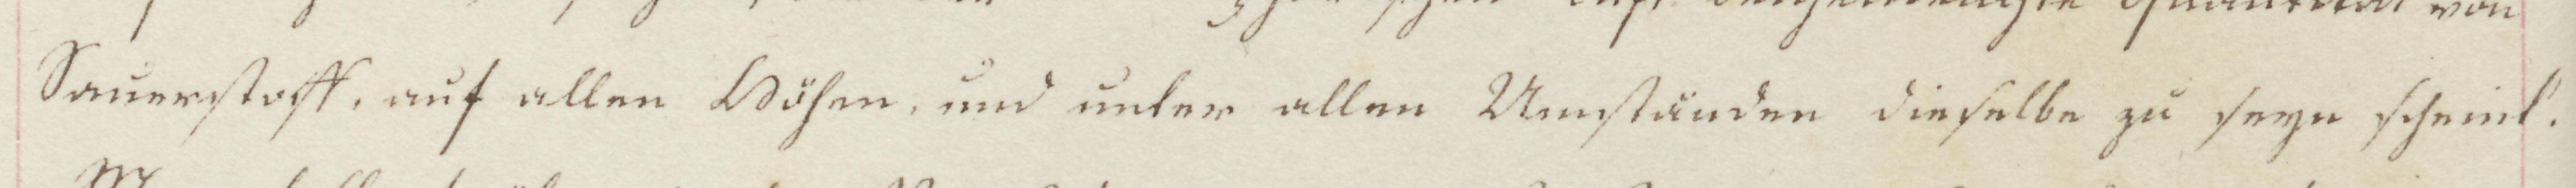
Sauerstoff, auf allen Höhen, und unter allen Umständen dieselbe zu seyn scheint.
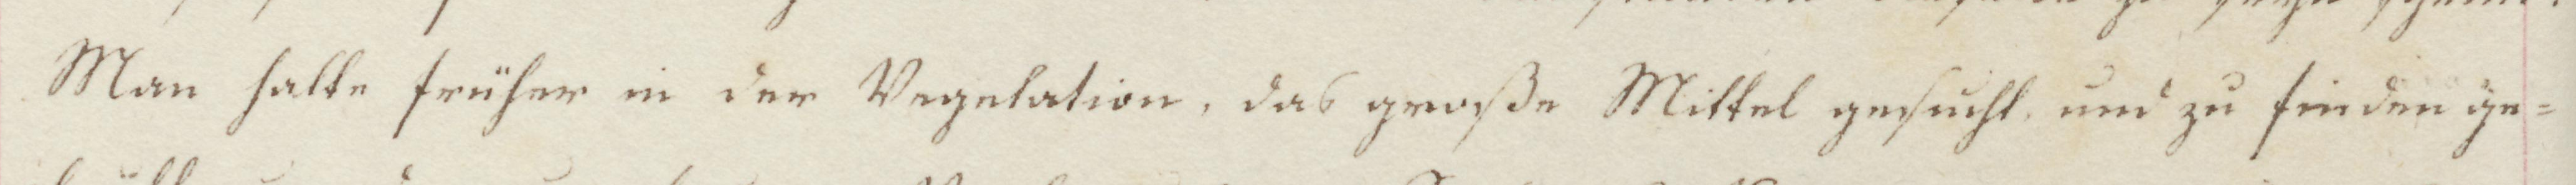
Man hatte früher in der Vegetation, das große Mittel gesucht und zu finden ge-
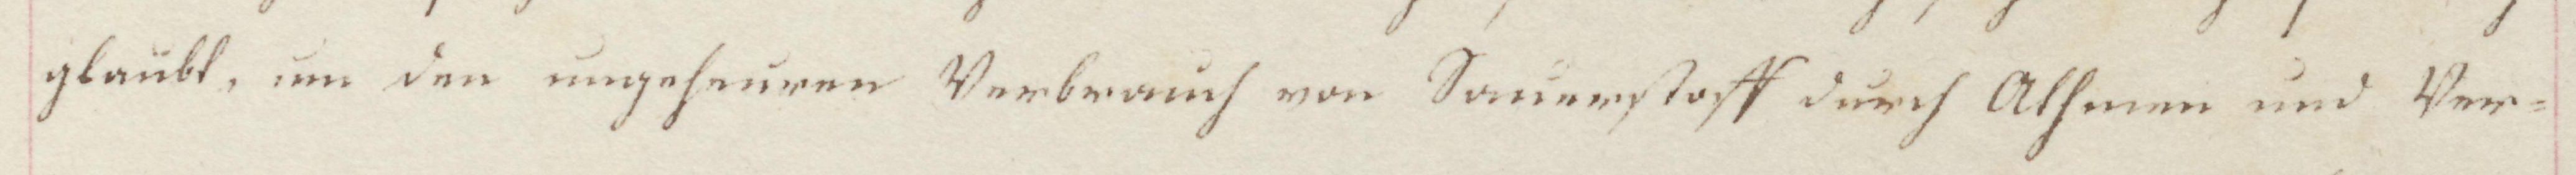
glaubt, um den ungeheuren Verbrauch von Sauerstoff durch Athmen und Ver-
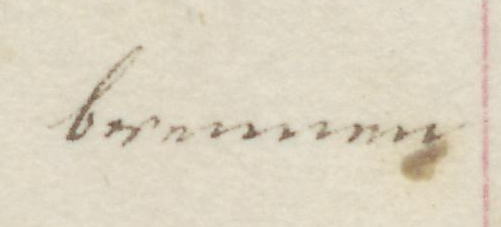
brennen
